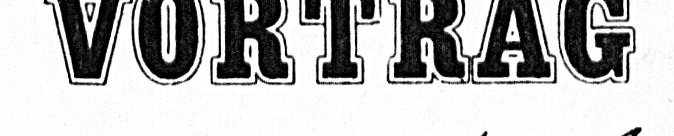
VORTRAG
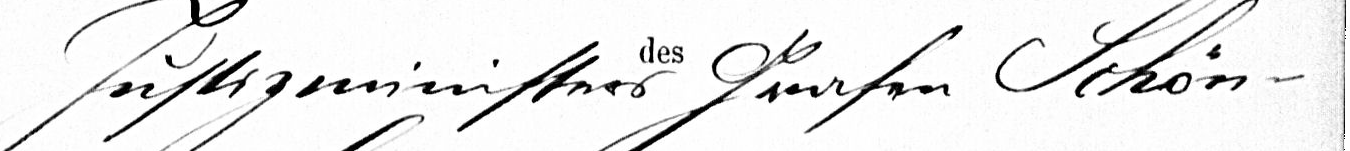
des
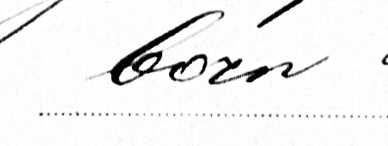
born
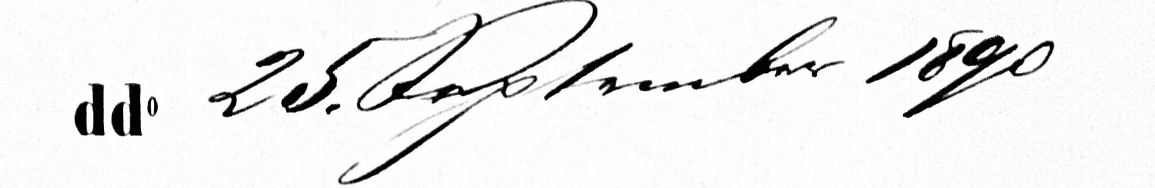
dd° 25. September 1890
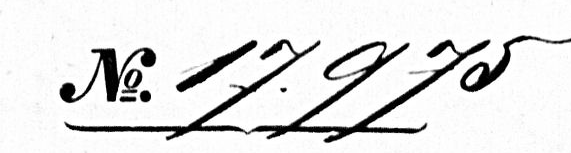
N° 17.975
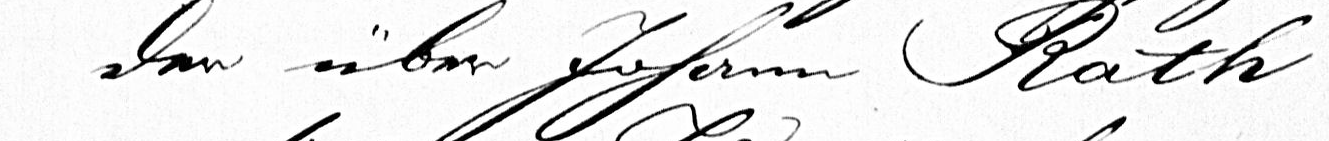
der über Johann Rath
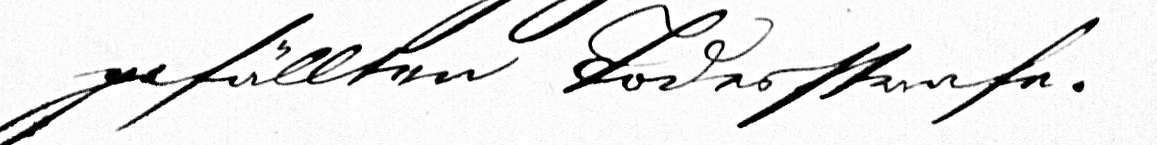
gefällten Todesstrafe.
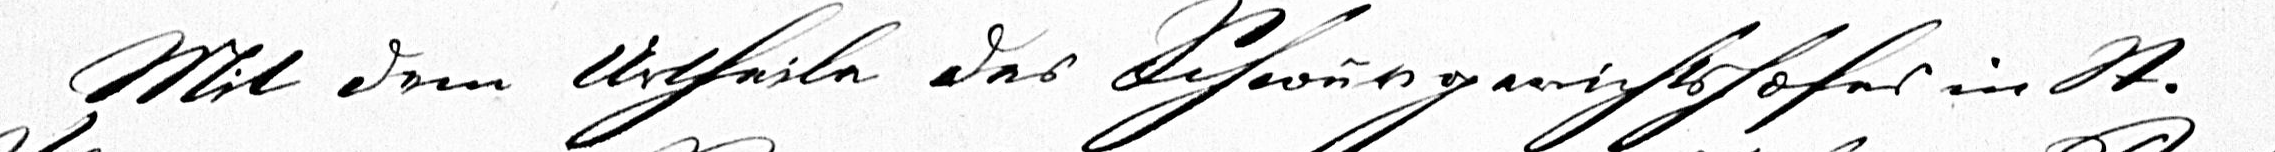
Mit dem Urtheile des Schwurgerichtshofes in St.
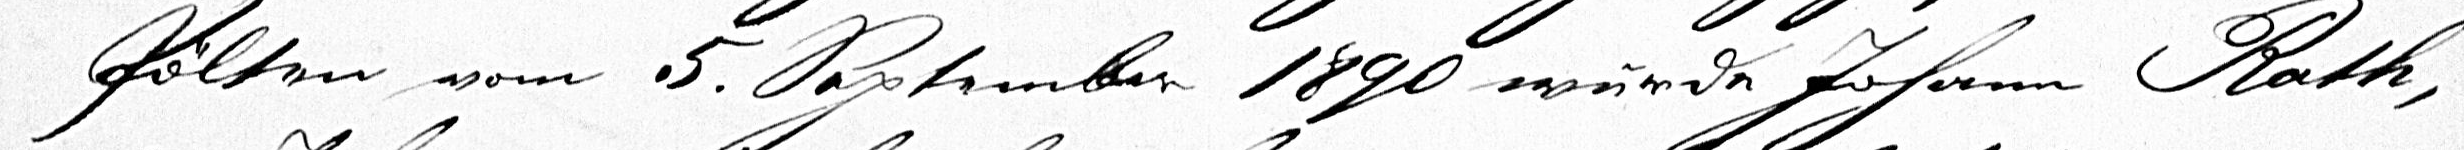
Pölten vom 5. September 1890 wurde Johann Rath,
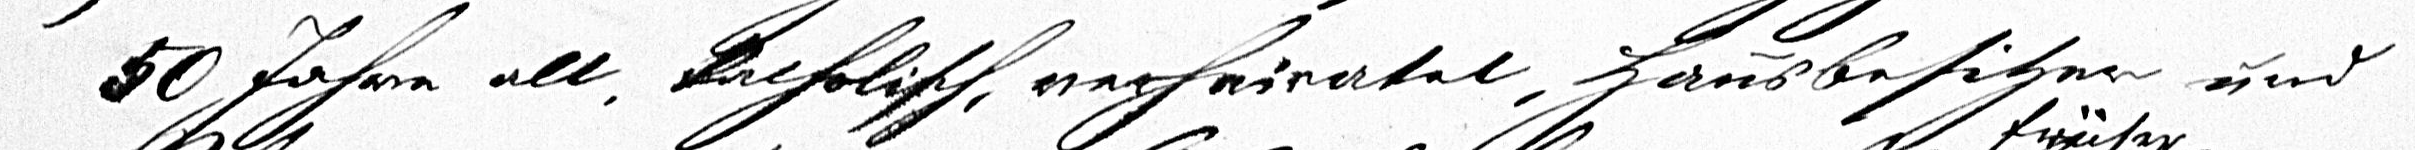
50 Jahre alt, katholisch, verheiratet, Hausbesitzer und
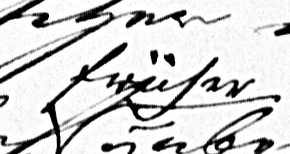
früher
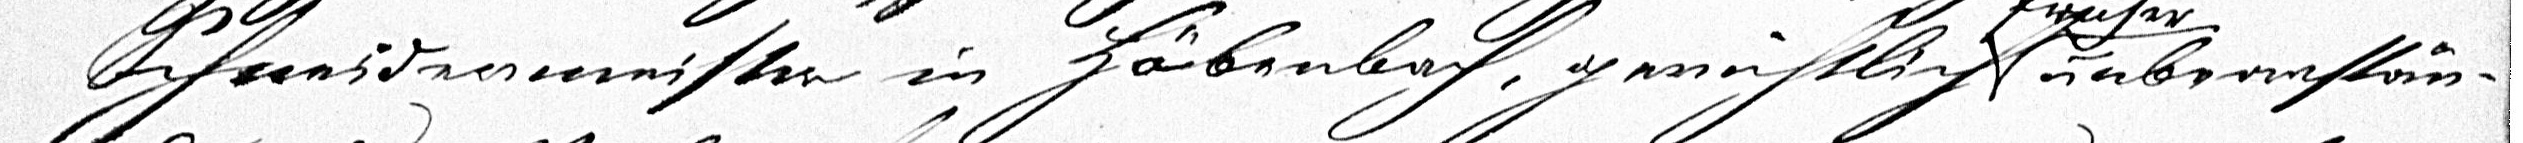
Schneidermeister in Höbenbach, gerichtlich unbeanstän¬
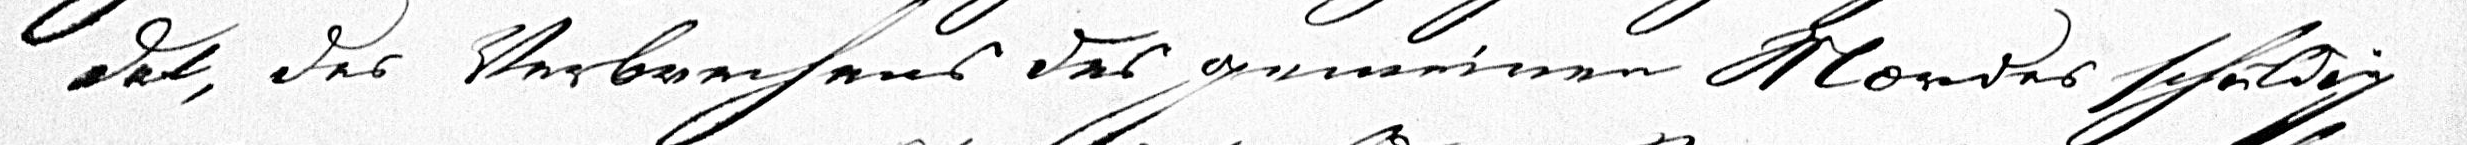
det, des Verbrechens des gemeinen Mordes schuldig
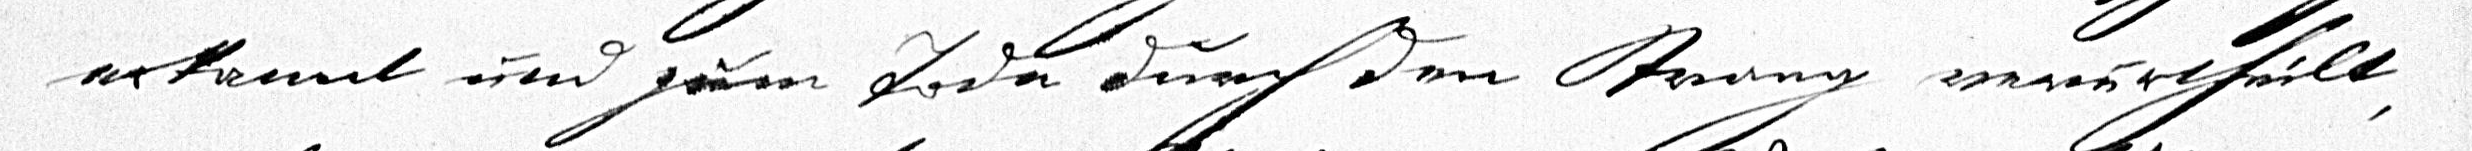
erkannt und zum Tode durch den Strang verurtheilt,
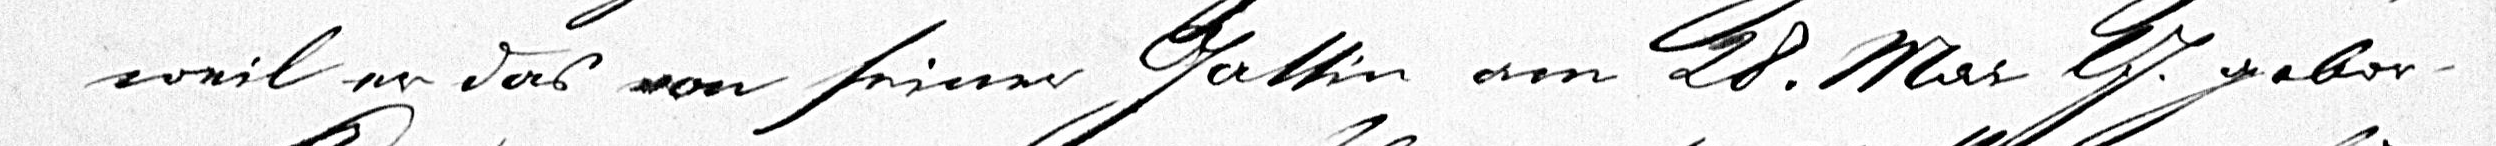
weil er das von seiner Gattin am 28. Mai lJ. gebor¬
